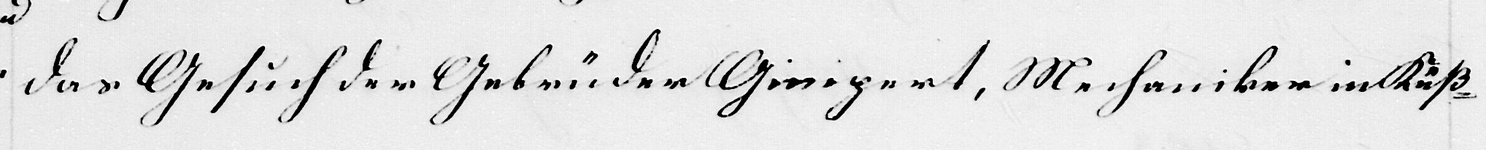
das Gesuch der Gebrüder Gimpert, Mechaniker in Küß¬
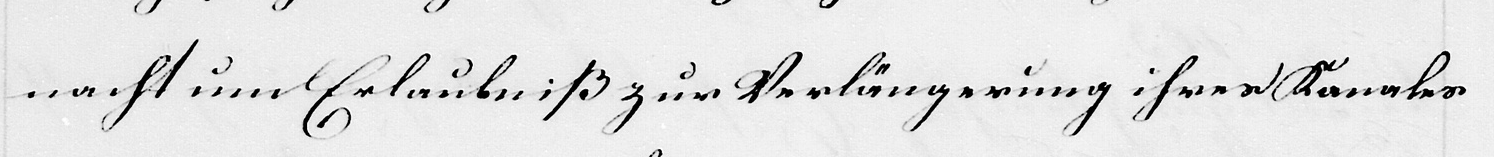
nacht um Erlaubniß zur Verlängerung ihres Kanales
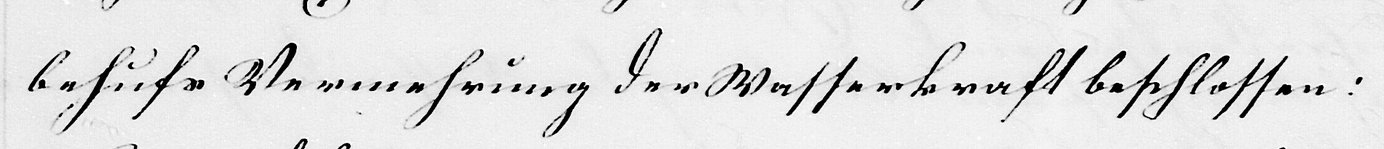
behufs Vermehrung der Wasserkraft beschlossen:
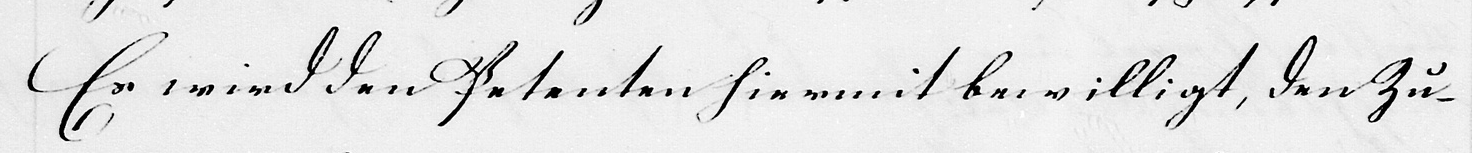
Es wird den Petenten hiermit bewilligt, den Zu¬
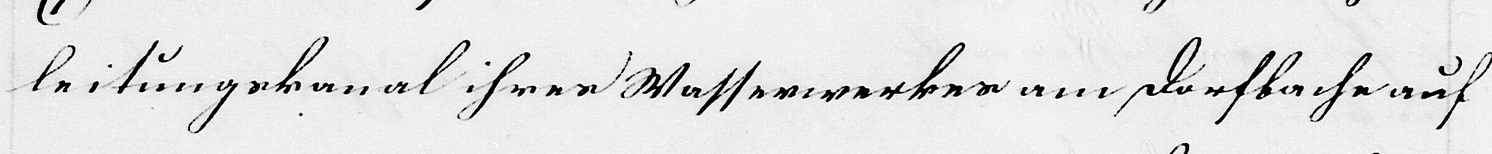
leitungskanal ihres Wasserwerkes am Dorfbache auf
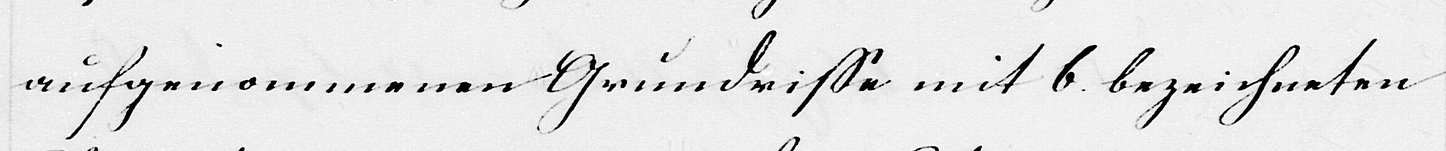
aufgenommenen Grundriße mit b. bezeichneten
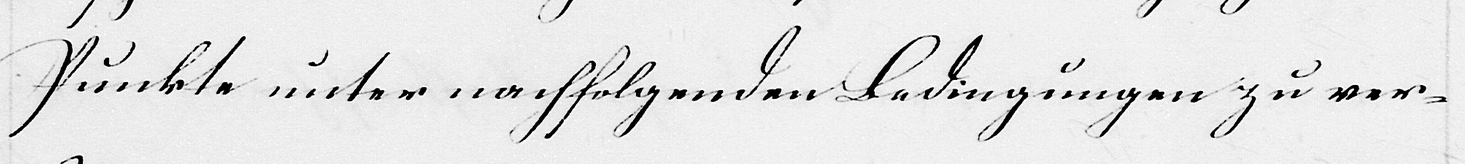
Punkte unter nachfolgenden Bedingungen zu ver¬
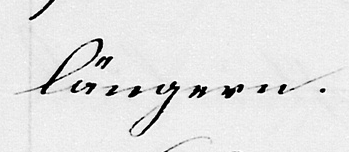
längern.
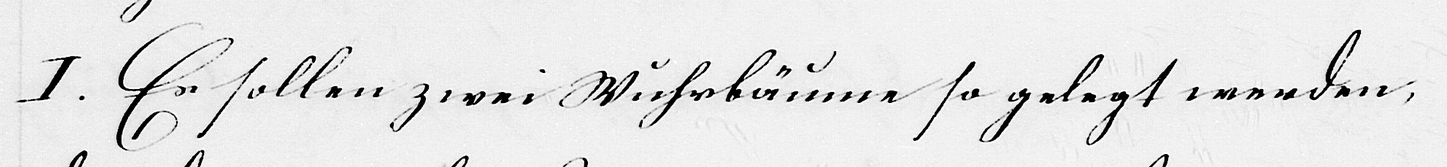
I. Es sollen zwei Wuhrbäume so gelegt werden,
